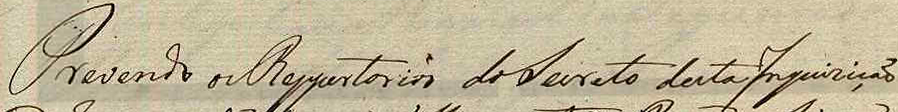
Prevendo os Reppertorios do Secreto desta Jnquiziçaõ
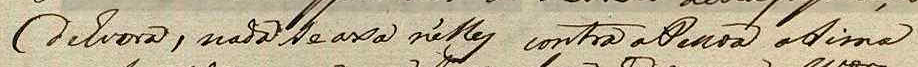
de Evora, nada se axa n'elles contra a Pessoa asima
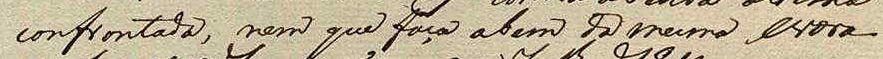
confrontada, nem que faça a bem da mesma Evora
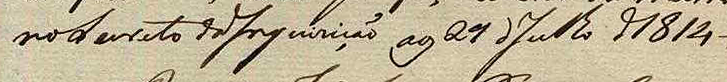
no Secreto da Jnquiziçaõ aos 29 d Julho d̄ 1814
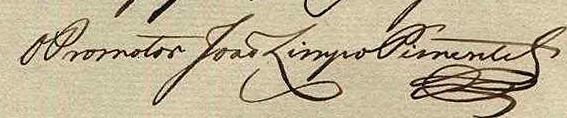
O Promotor Joaõ Limpo Pimentel
